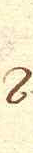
2
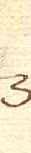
3
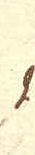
1
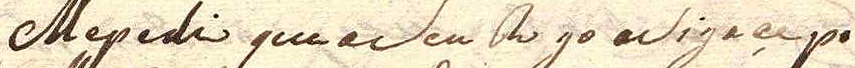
Me pedio que a seu Rogo asignaçe po
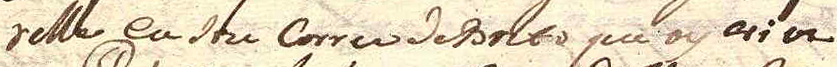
r elle eu Ioze Correa de Brito que o escrivi
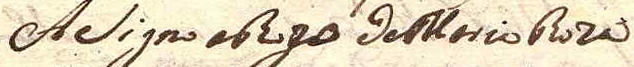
Asigno a Rogo de Mario Roza
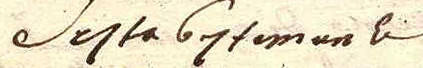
Sesta Testemunha
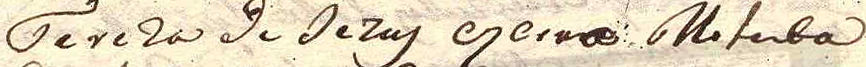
Tereza de Iezus escrava Motuba
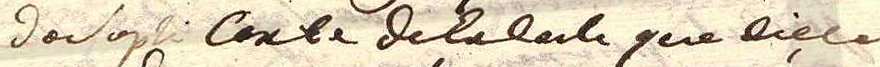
do suplicante de dehaleite que diçia
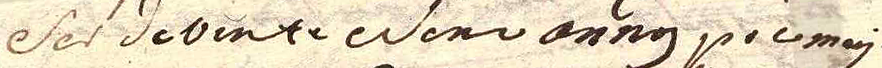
ser de vinte e sinco annos poco mais
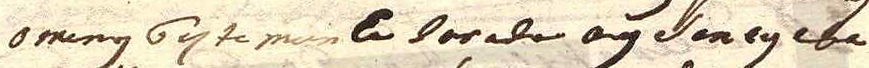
o menos Testemunha Iorada aos santos eva
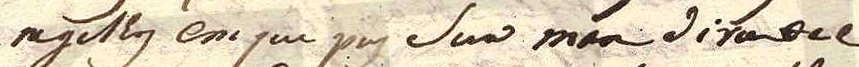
ngelhos em que pus sua man direita e
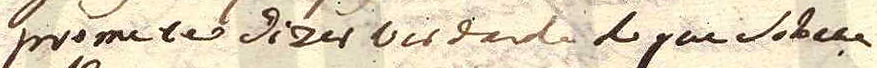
prometeo dizer verdade de que sobeçe
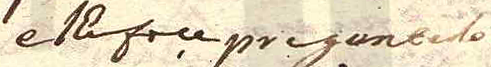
e lhe foçe preguntado
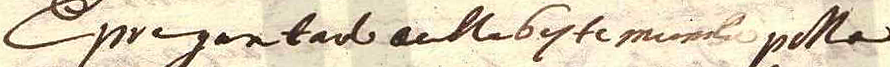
E preguntado a ella Testemunha pella
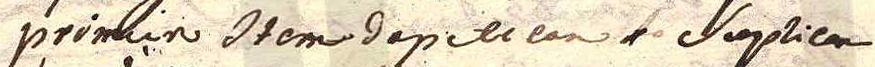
primeiro Item da piticam do suplican
